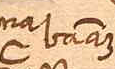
Cna Vaāz
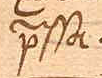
p̄ssa.
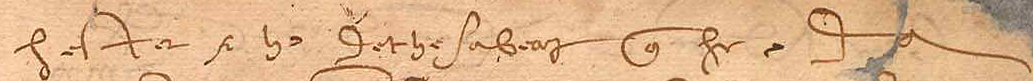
hester e ho de thesabeat q̄ he o da
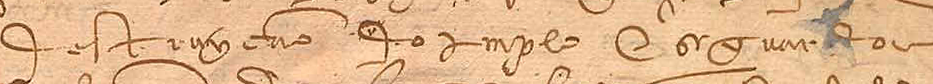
destruyção do templo e se guardou
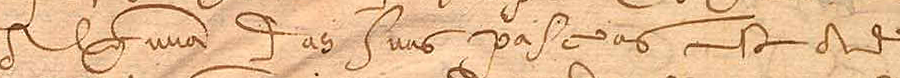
Algūua das suas pascoas .s. A do
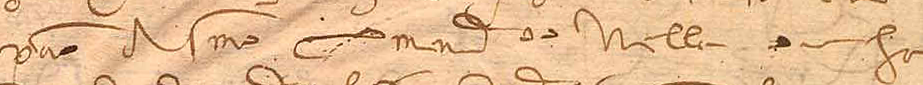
pão Asmo comendoo Nella ou ha
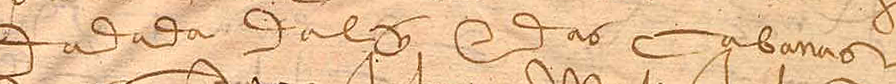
da dada da ley e das Cabanas
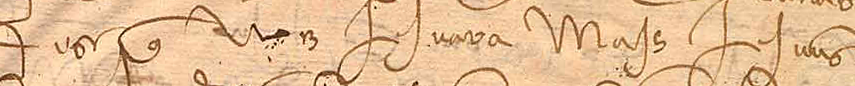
dise q̄ nom JeJuara Majs JeJuūs
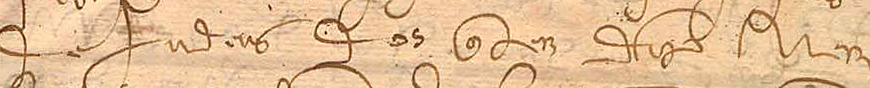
de Judeus dos q̄ tem dīto Nem
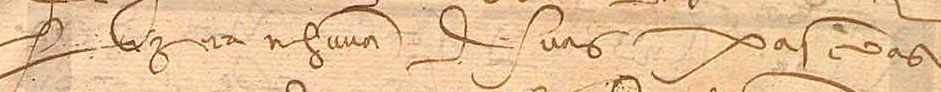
fizera nhūua de suas pascoas
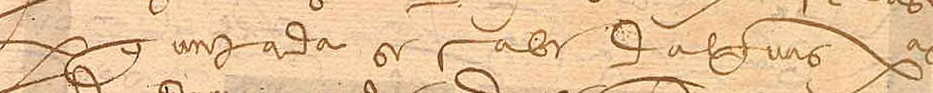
ꝑguntada se sabe dalgūas pas
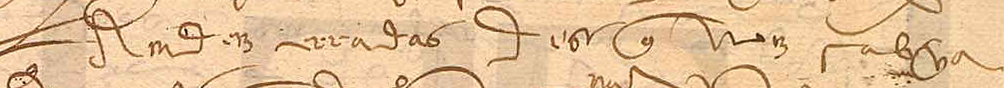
q̄ Amdem erradas dise q̄ nom sabya
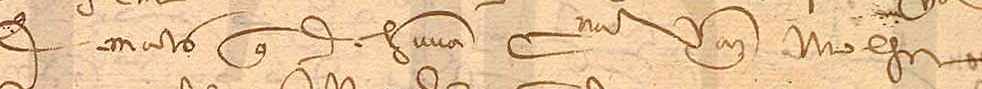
de majs q̄ de hūua Cna Vāz molher
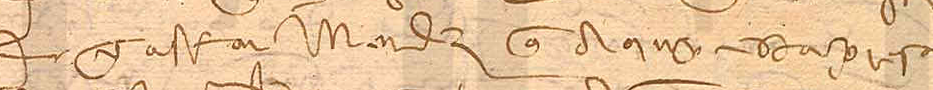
de gaspar Mendez q̄ Aquy esta presa
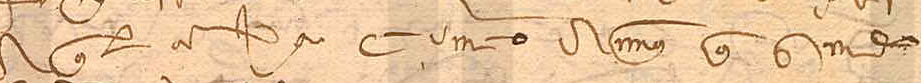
A q̄l aꝟa cimco Ann̄ꝯ q̄ semdo
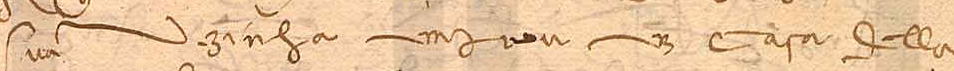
sua vezinha emtrou em casa della
